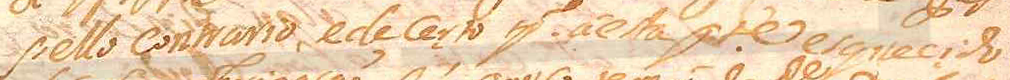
pello contrario, e de certo tp.o a esta pt.e esquecido
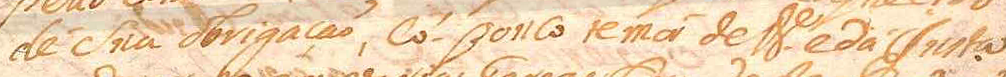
de Sua obrigaçaõ, cō pouco temor de Ds e da Iust.a
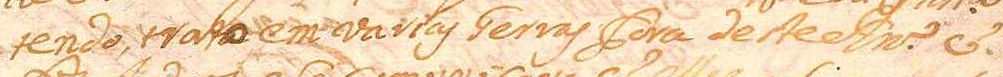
tendo, trato em varias terras fora deste Rn.o cō
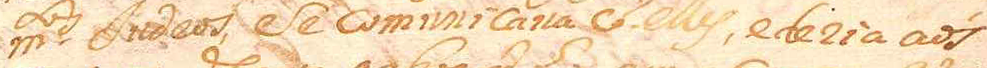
m.tos Iudeos, Se comunicaua cō elles, e dezia aos
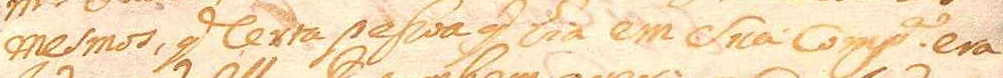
mesmos, q̄ certa pessoa q̄ hia em sua comp.a era
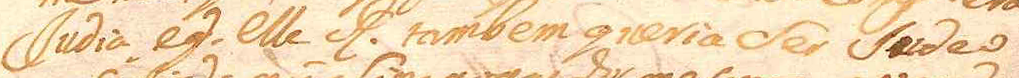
Iudia e q̄ elle R. tambem queria ser Iudeo
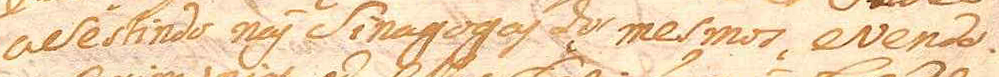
asestindo nas Sinagogas dos mesmos, e vendo
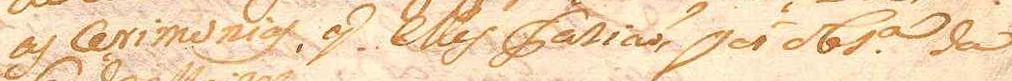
as cerimonias, q̄ elles faziaõ, por obs.a da
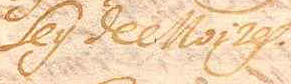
Ley de Moizes.
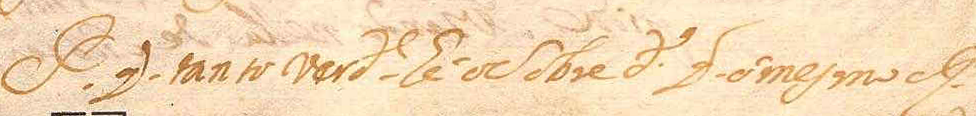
P. q̄. tanto verd̄.e hé o sobred̄.o q̄ o mesmo R.
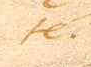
tē
